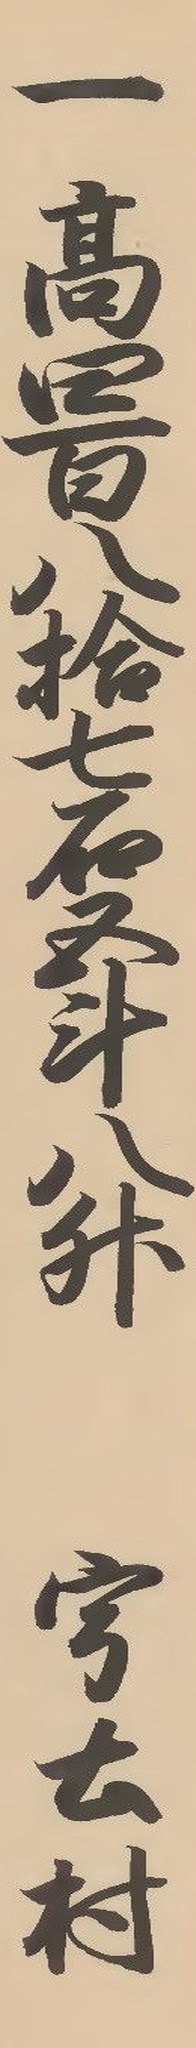一高四百八拾七石五斗八升宇土村
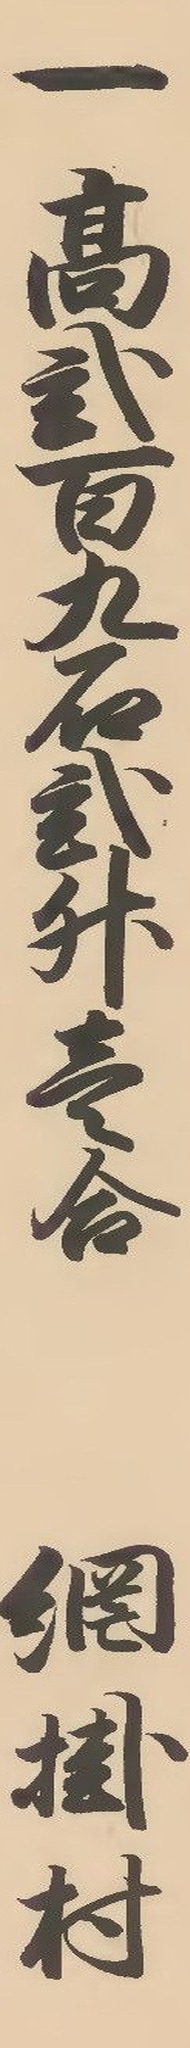一高弐百九石弐升壱合網掛村
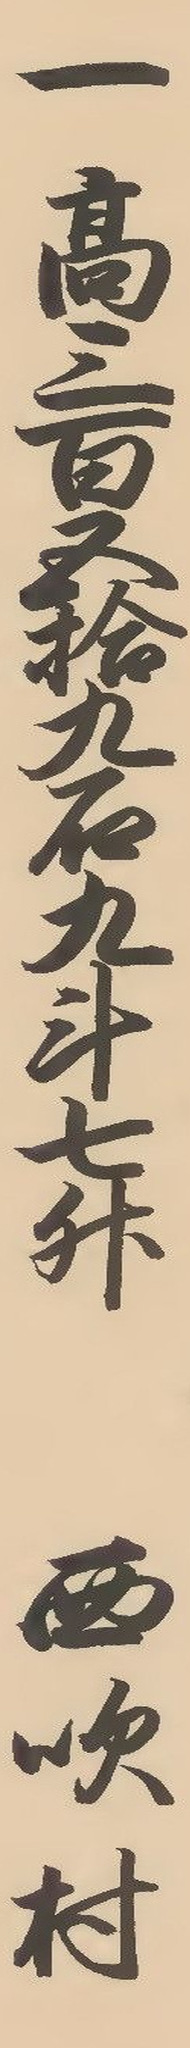一高三百五拾九石九斗七升西吹村
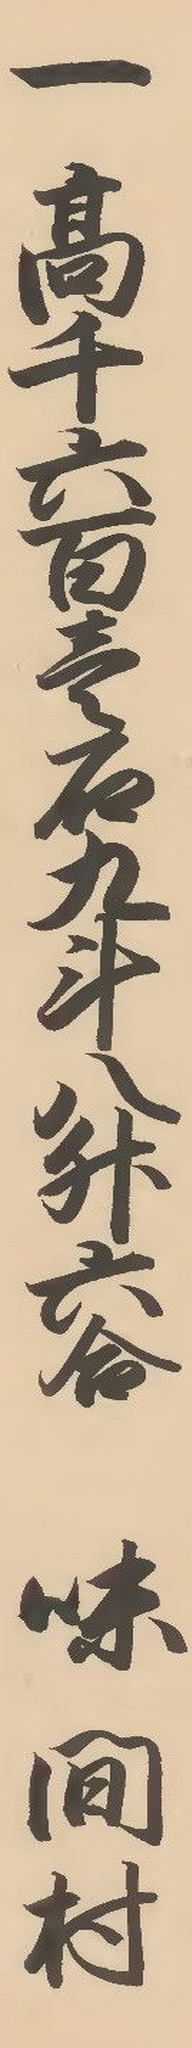一高千六百壱石九斗八升六合味間村

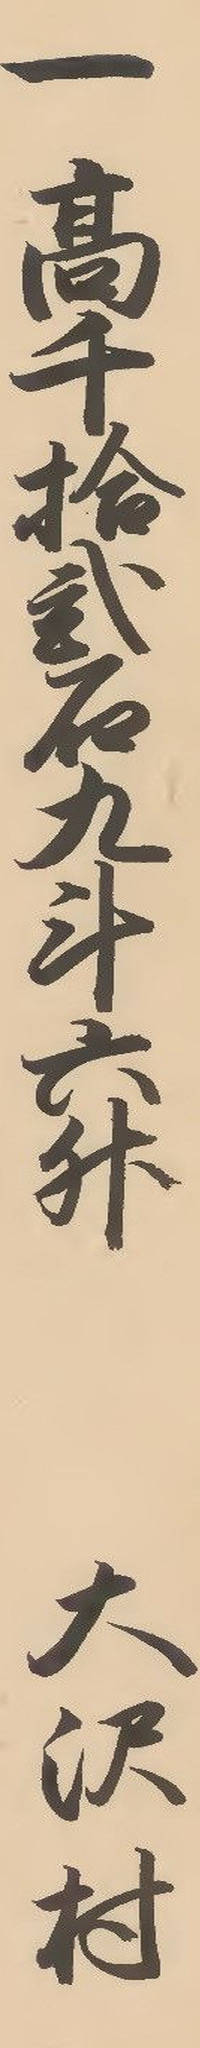一高千拾弐石九斗六升大沢村
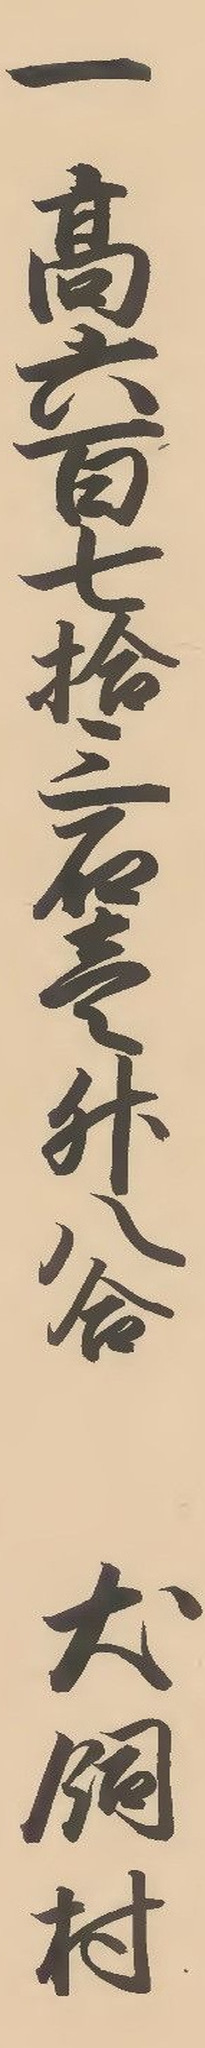一高六百七拾三石壱升八合犬飼村
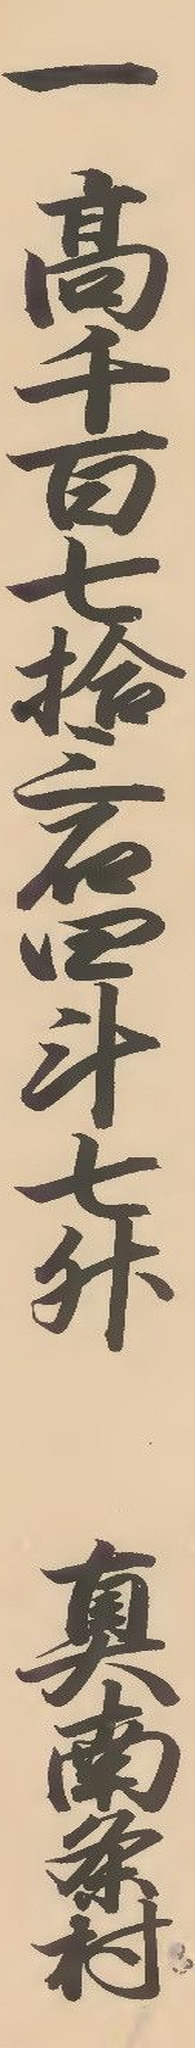一高千百七拾三石四斗七升真南条村
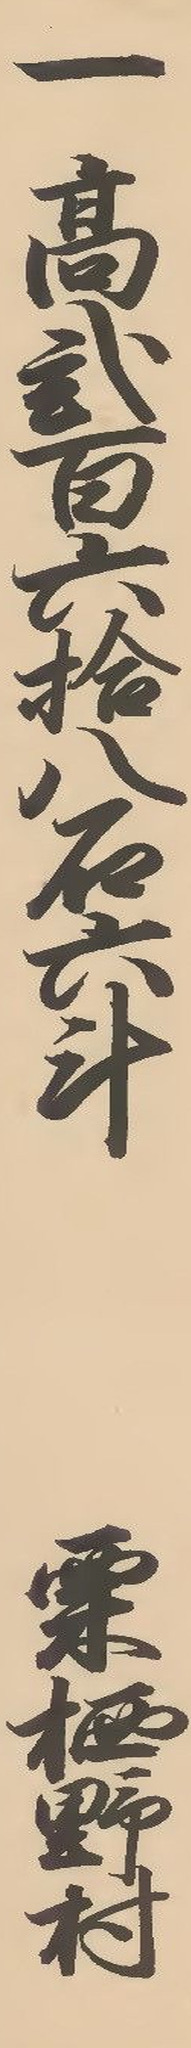一高弐百六拾八石六斗栗栖野村
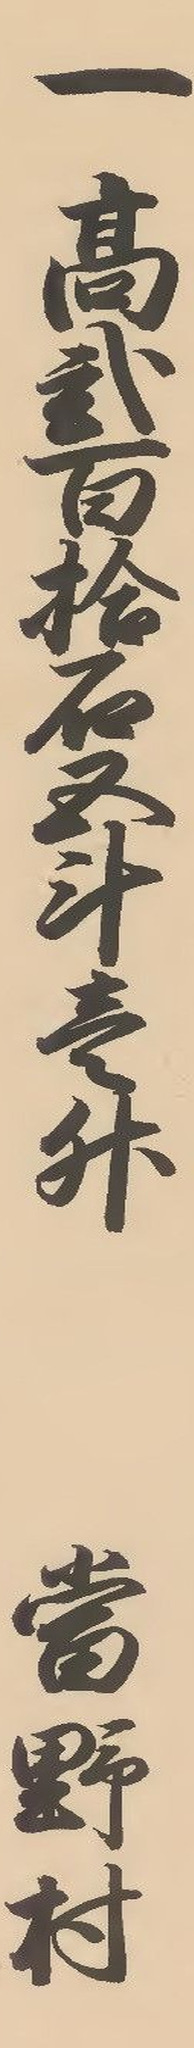一高弐百拾石五斗壱升当野村
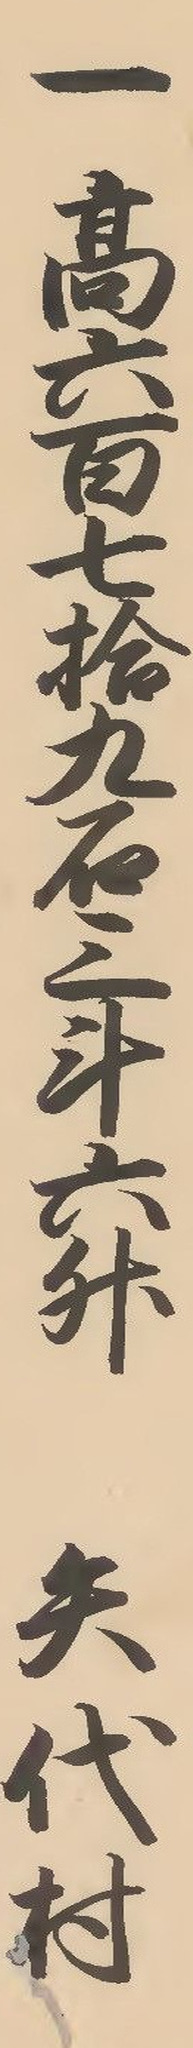一高六百七拾九石三斗六升矢代村
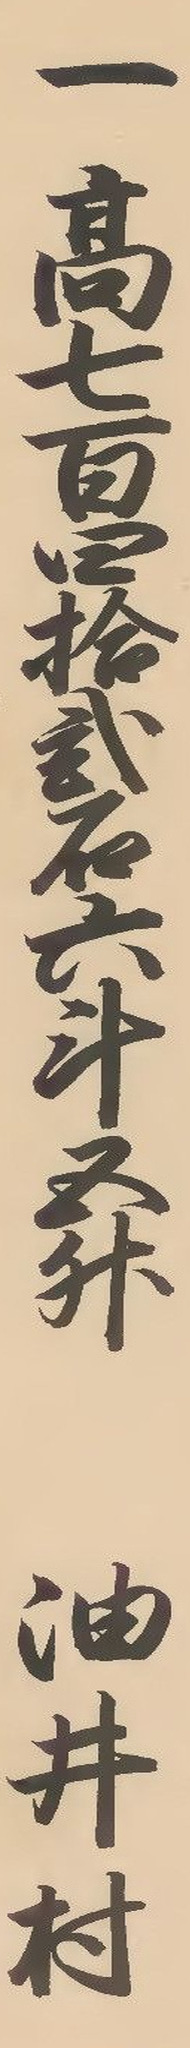一高七百四拾弐石六斗五升油井村

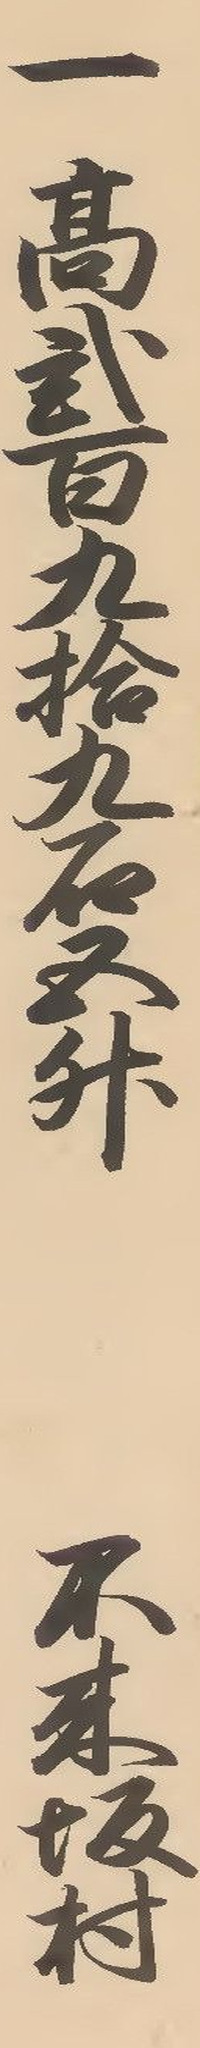一高弐百九拾九石五升不来坂村
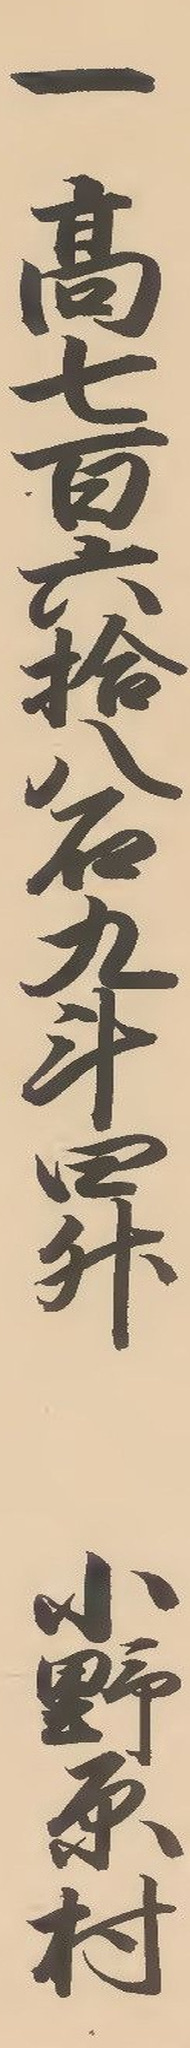一高七百六拾八石九斗四升小野原村
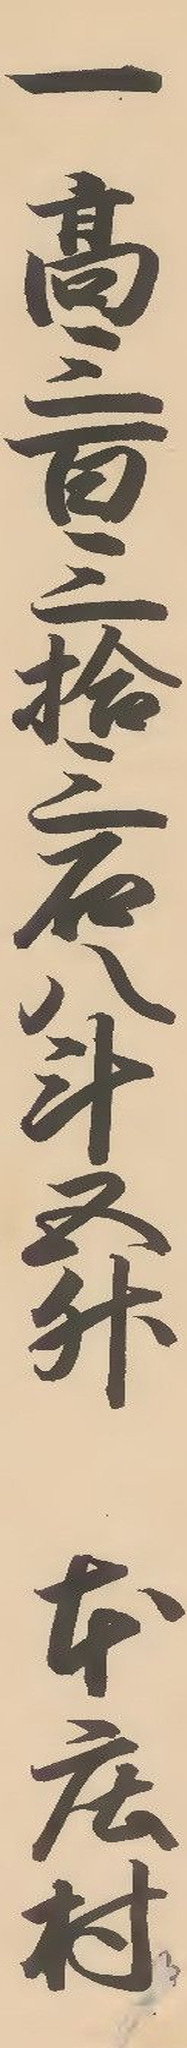一高三百三拾三石八斗五升本庄村
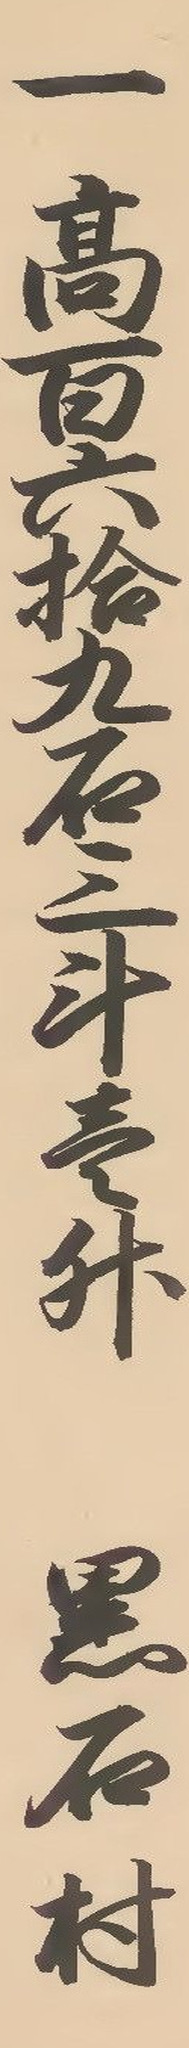一高百六拾九石三斗壱升黒石村
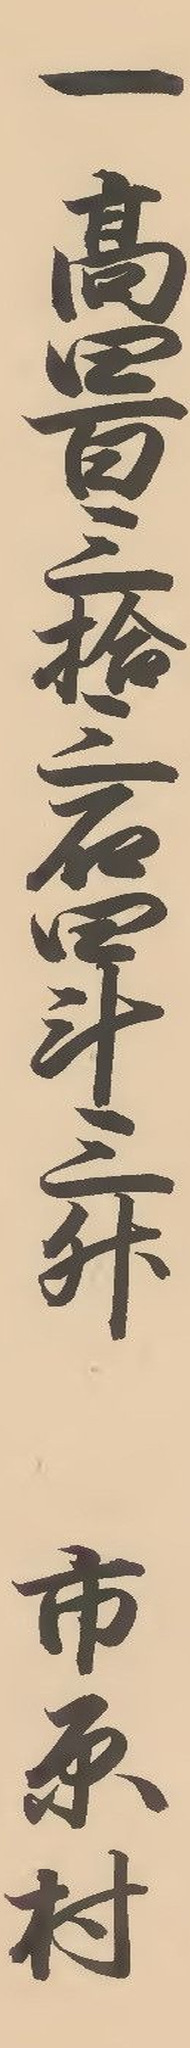一高四百三拾三石四斗三升市原村
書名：丹波国郷帳
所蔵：国立公文書館 National Archives of Japan
